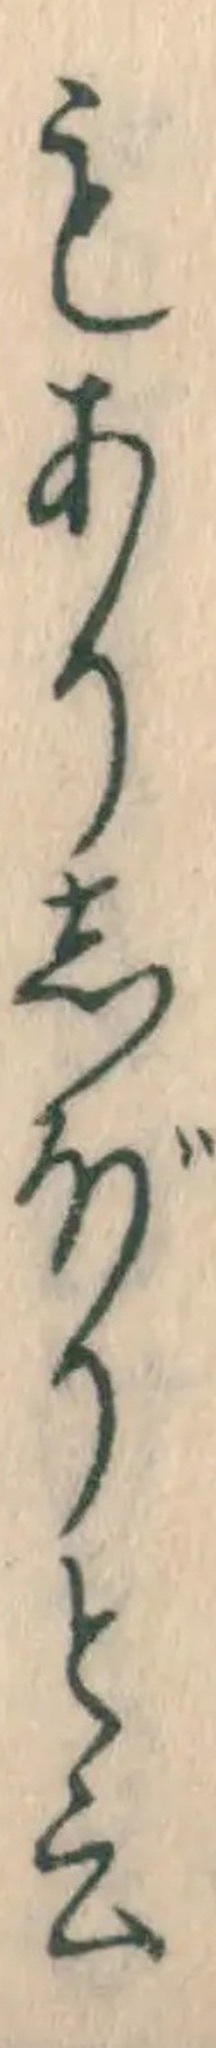もありしぼりと云

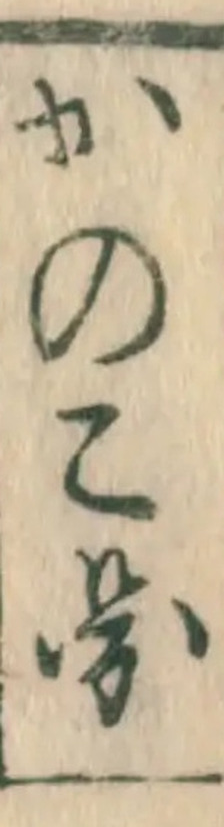かのこ図
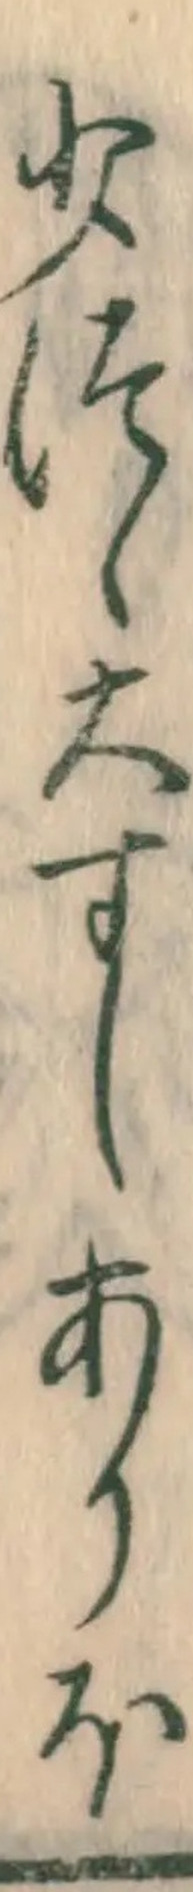少つゝ大すしありほ
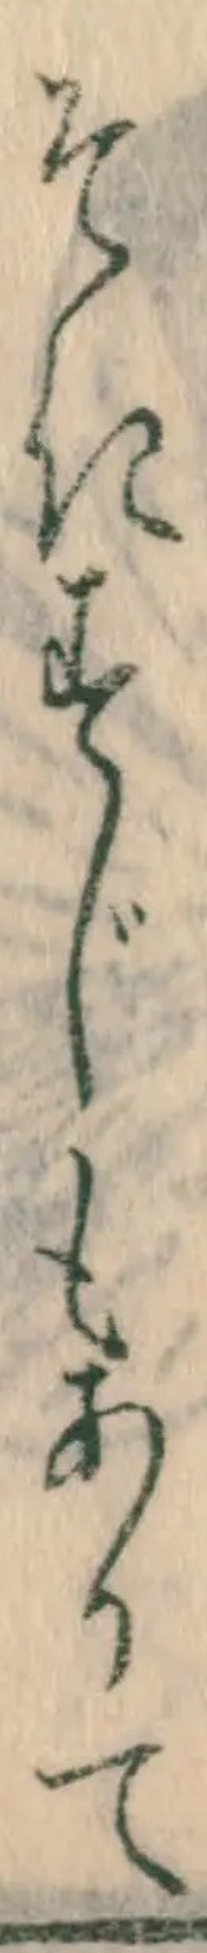そきすじもありて
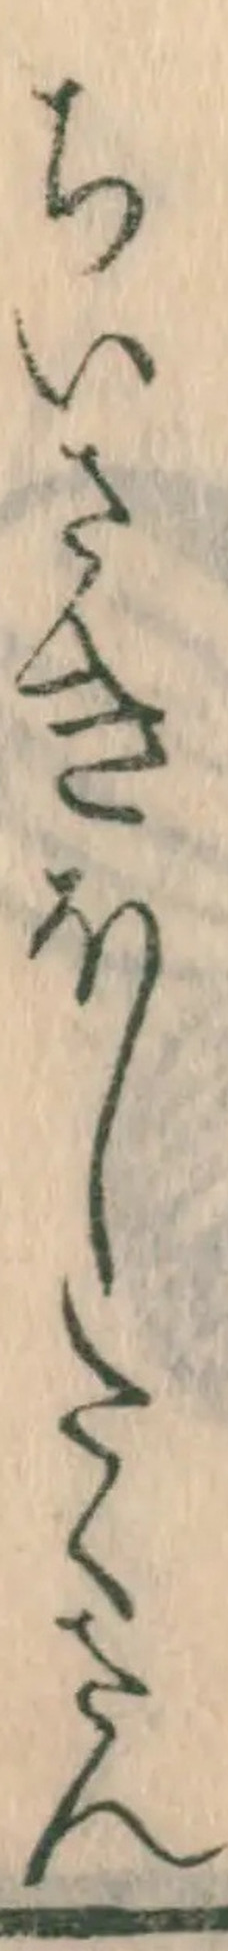ちいさきほしたくさん
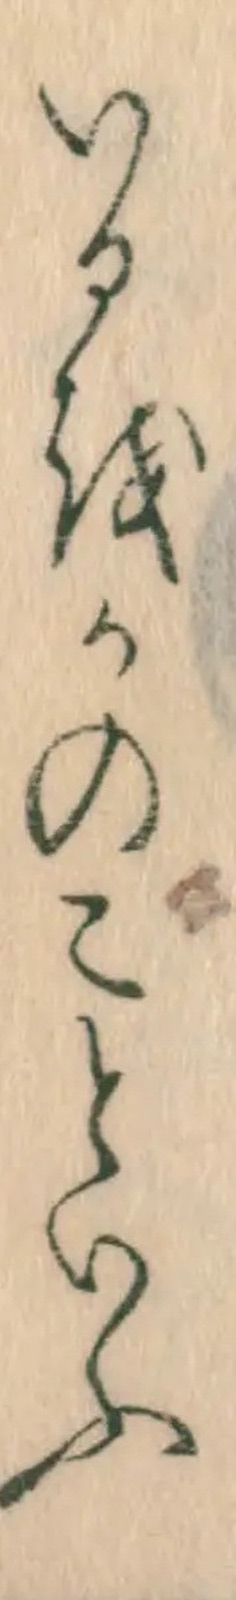いるをかのこといふ
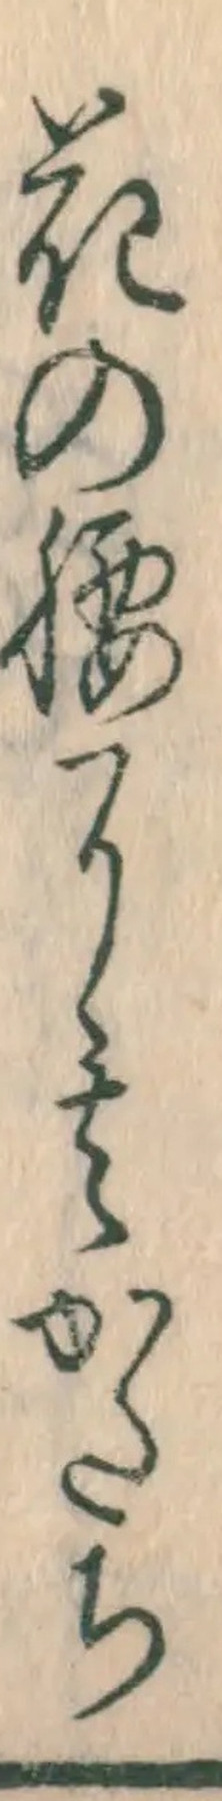花の腰に其かたち
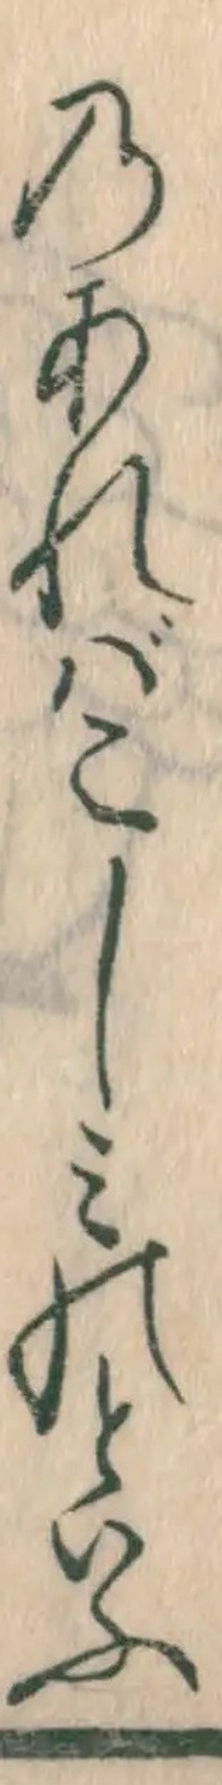のあればこしみのといふ
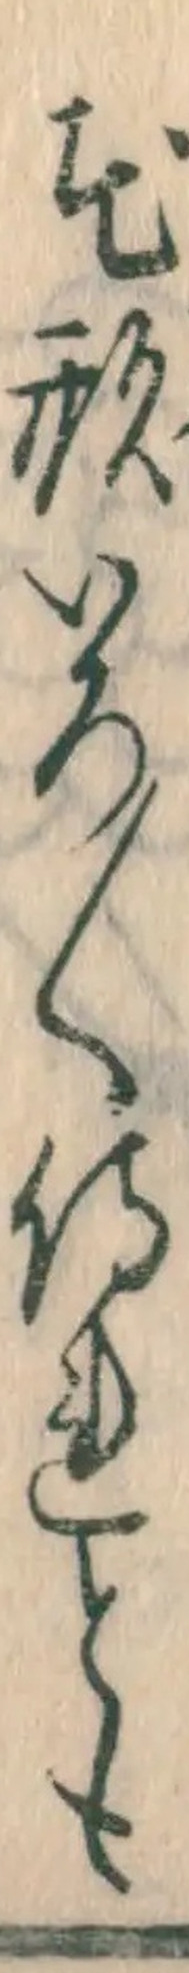花形いろ〳〵侍れとも
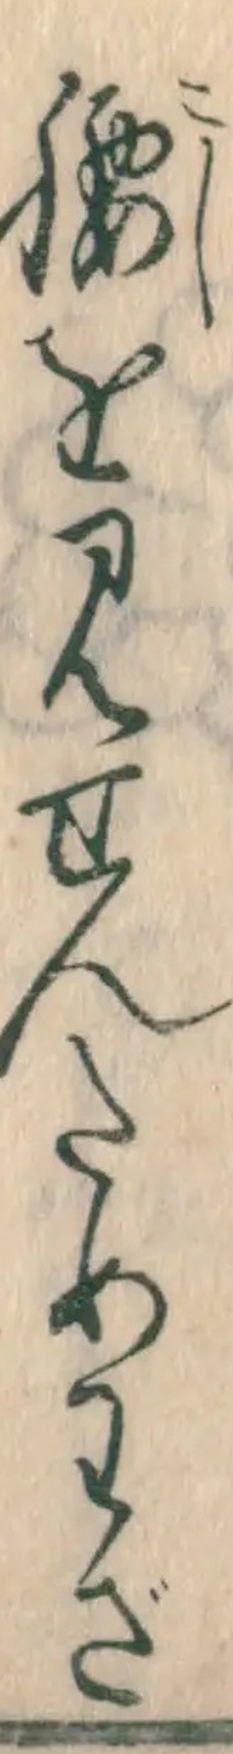腰を見せんためわざ
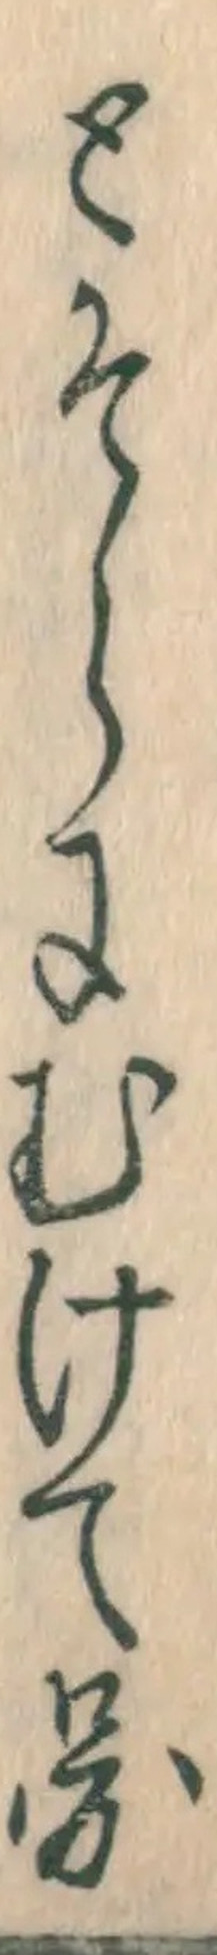とそらにむけて図
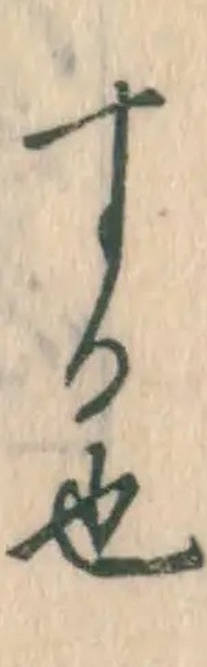する也

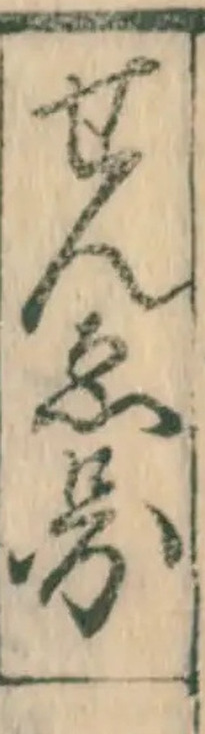せんゑ図
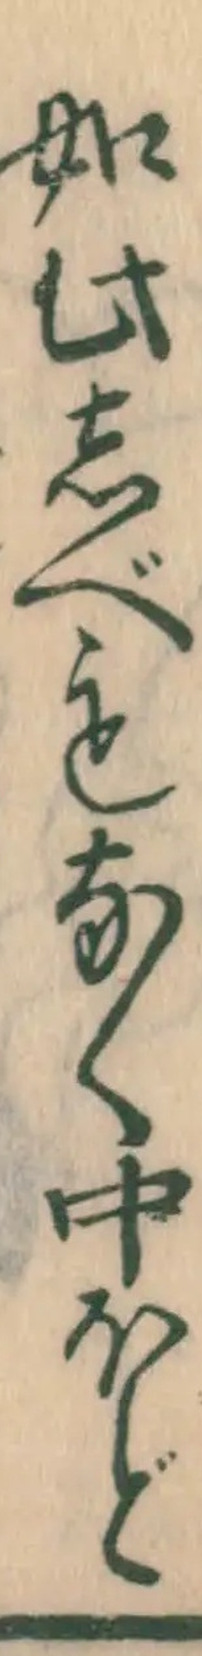如此しべもなく中ほど
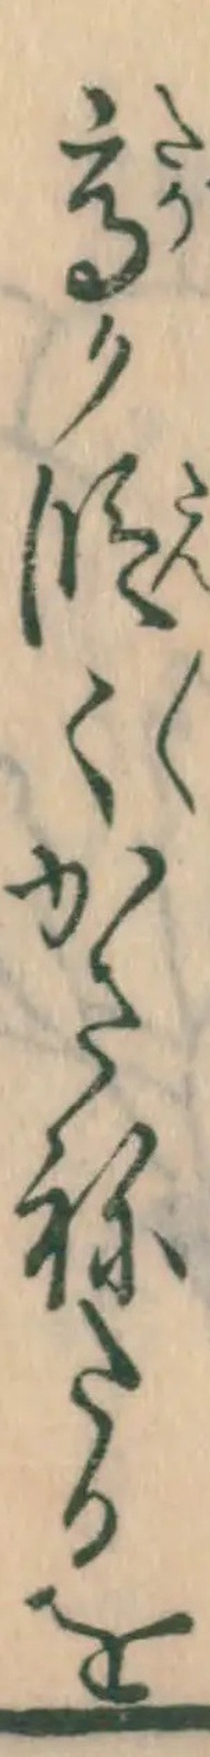高く段々かさねたるを
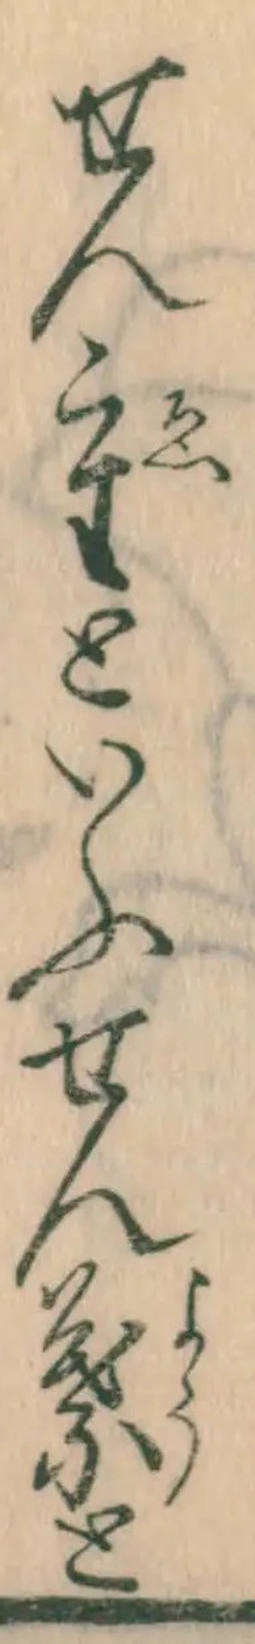せん重といふせん葉と
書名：錦繍枕 5巻. [1]
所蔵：国立国会図書館 National Diet Library, JAPAN
